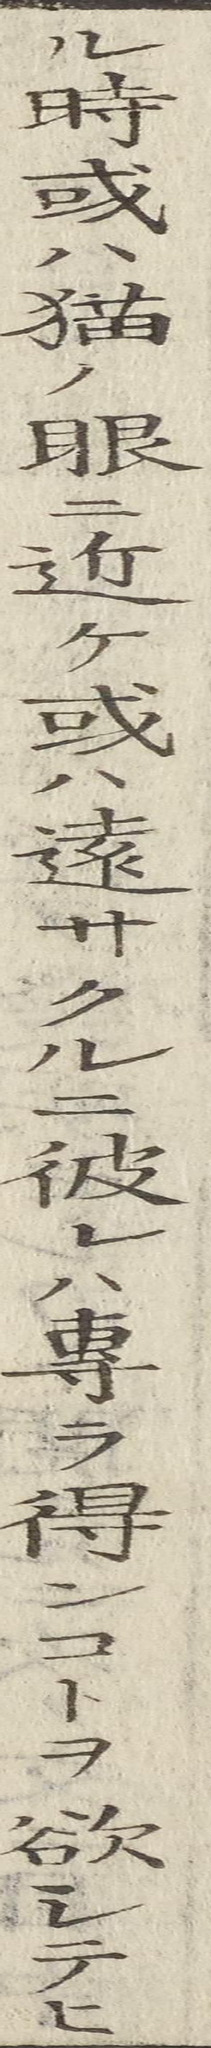ル時或ハ猫ノ眼ニ近ケ或ハ遠サクルニ彼レハ専ラ得ンコトヲ欲シテヒ
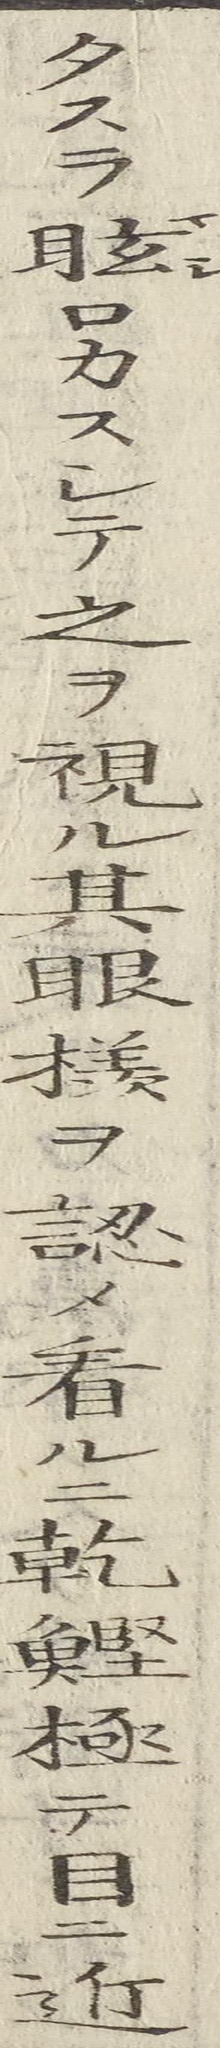タスラ眩ロカスシテ之ヲ視ル其眼様ヲ認メ看ルニ乾鰹極テ目ニ近
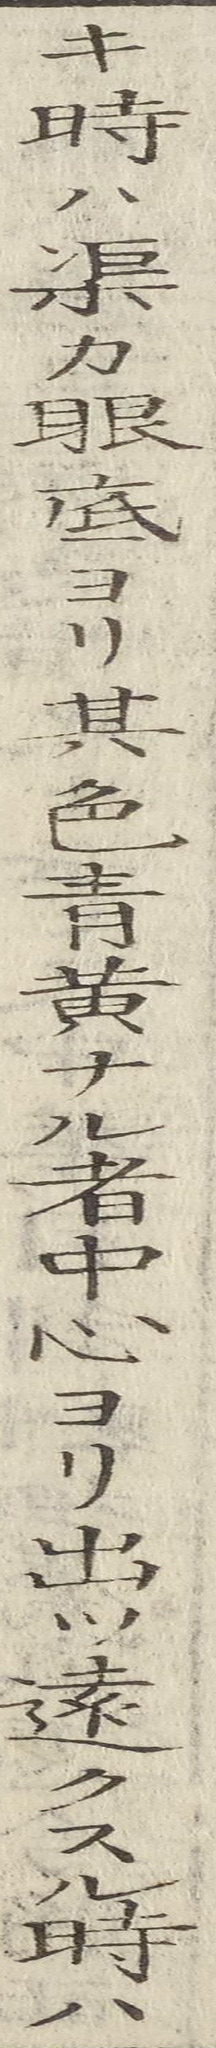キ時ハ渠カ眼底ヨリ其色青黄ナル者中心ヨリ出ツ遠クスル時ハ
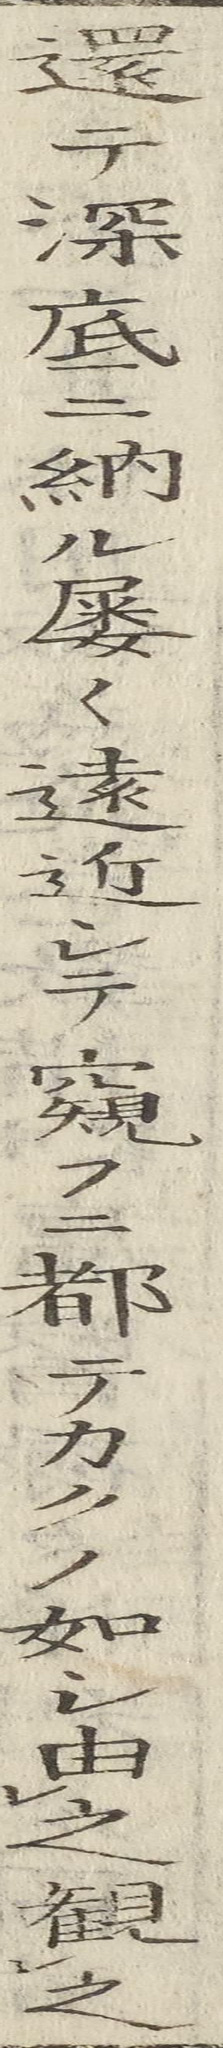還テ深底ニ納ル屡〱遠近シテ窺フニ都テカクノ如シ由之観之
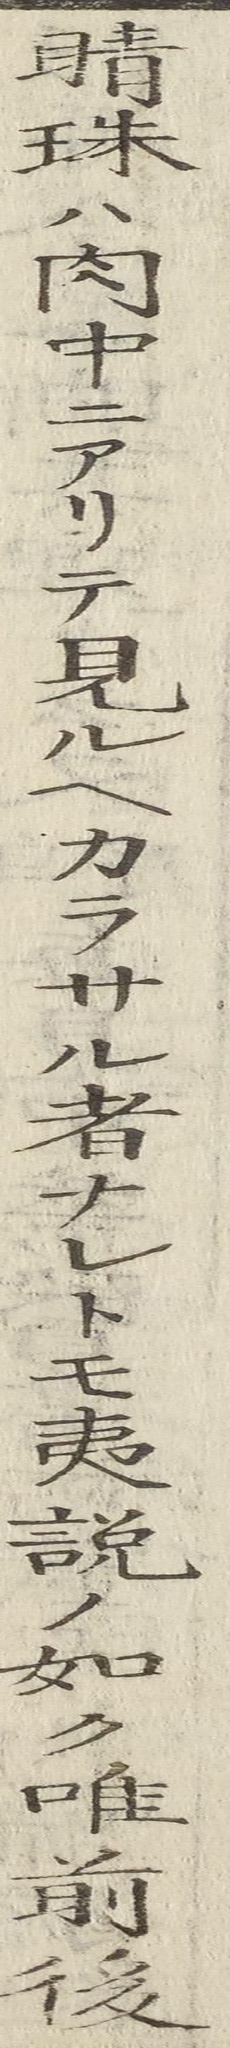睛珠ハ肉中ニアリテ見ルヘカラサル者ナレトモ夷説ノ如ク唯前後
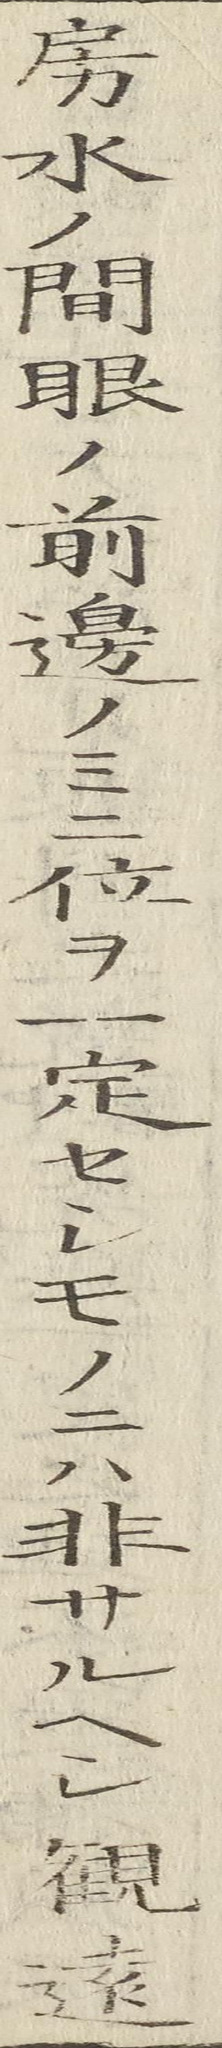房水ノ間眼ノ前辺ノミニ位ヲ一定セシモノニハ非サルヘシ観遠
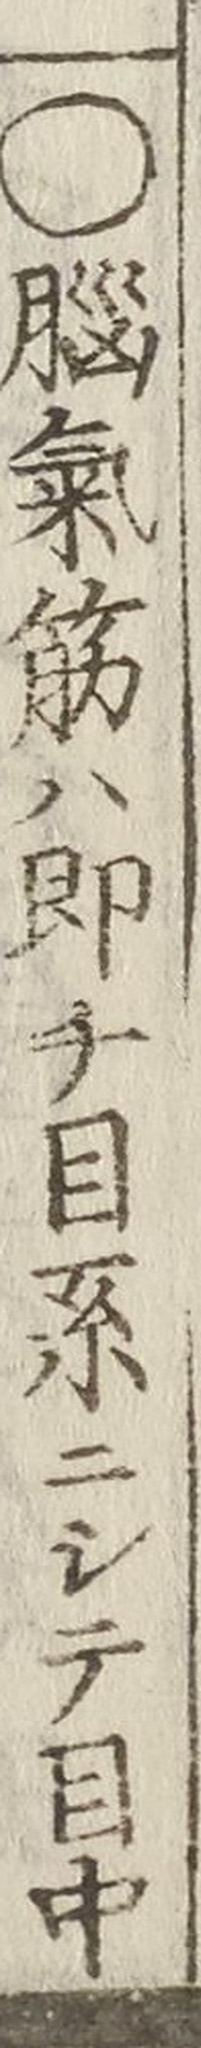〇脳気筋ハ即チ目系ニシテ目中
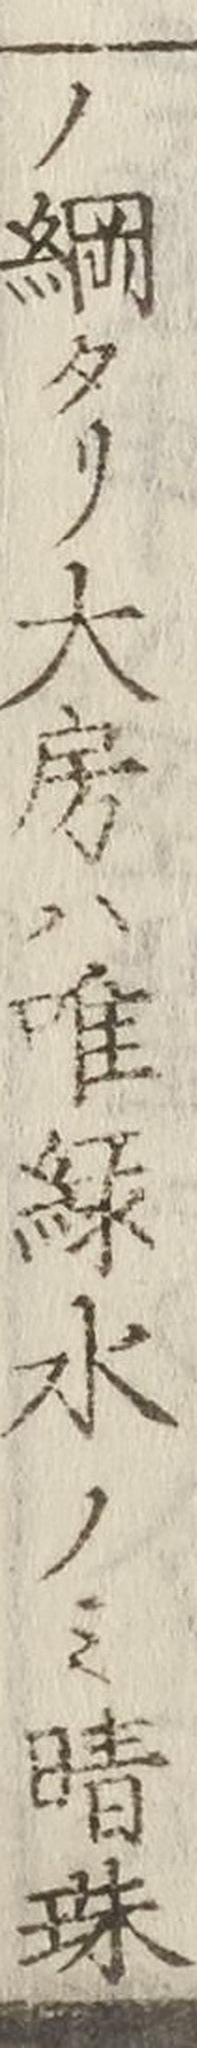ノ綱タリ大房ハ唯緑水ノミ晴珠
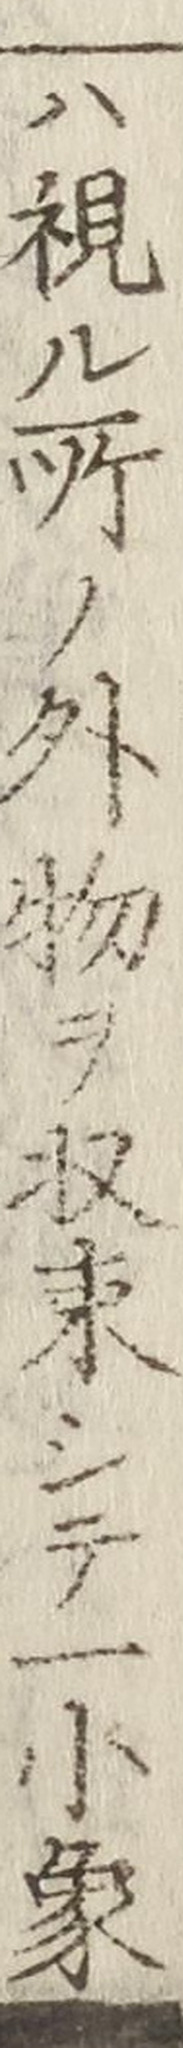ハ視ル所ノ外物ヲ収束シテ一小象
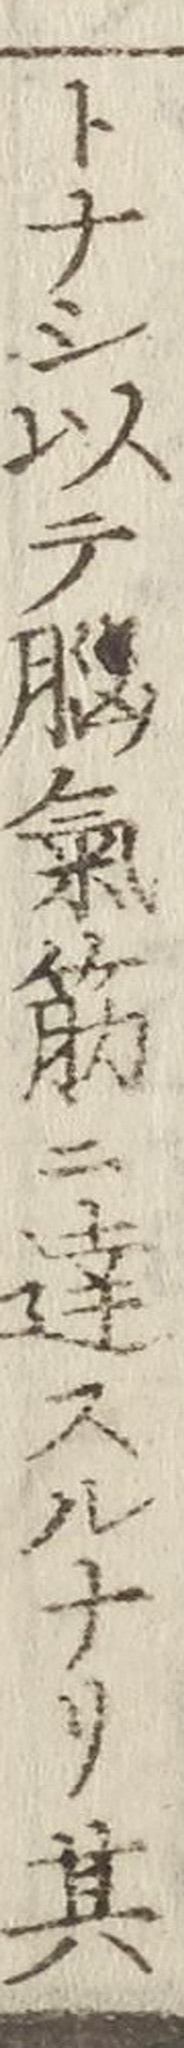トナシ以テ脳気筋ニ達スルナリ其
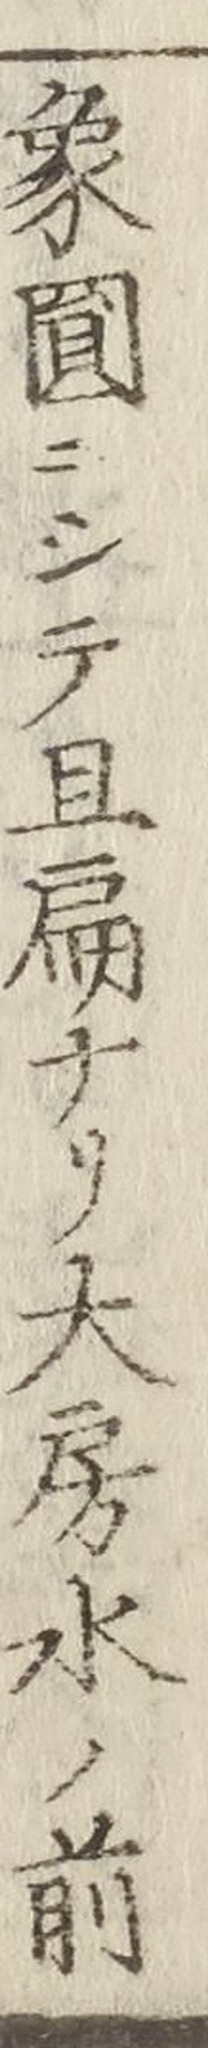象円ニシテ且扁ナリ大房水ノ前
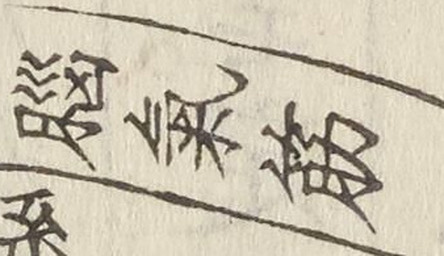脳気筋
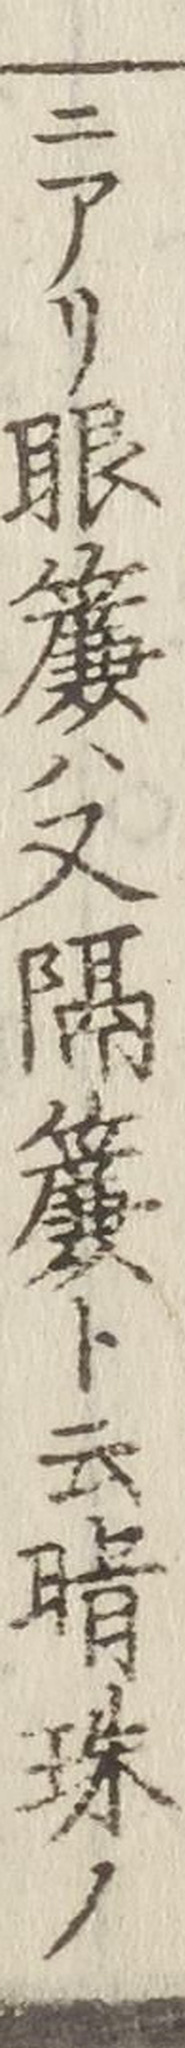ニアリ眼簾ハ又隔簾ト云晴珠ノ
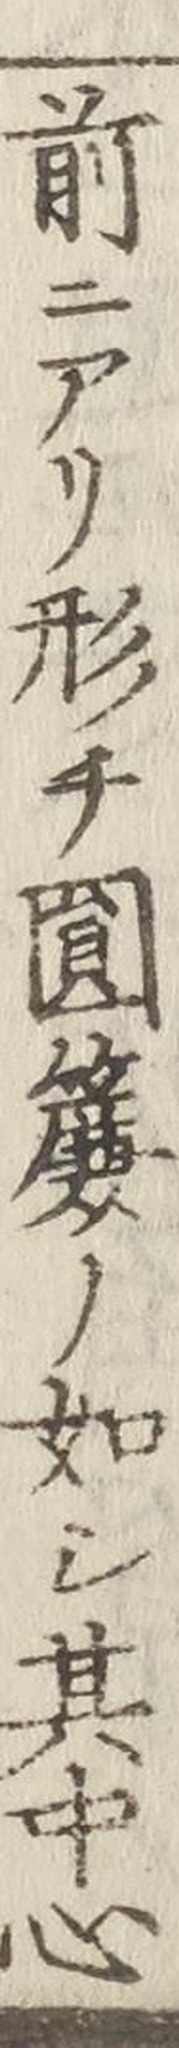前ニアリ形チ円簾ノ如シ其中心
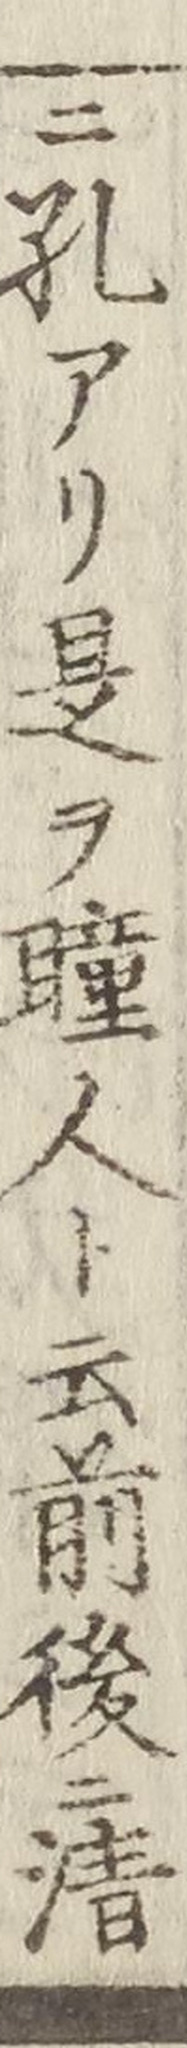ニ孔アリ是ヲ瞳人ト云前後ニ清
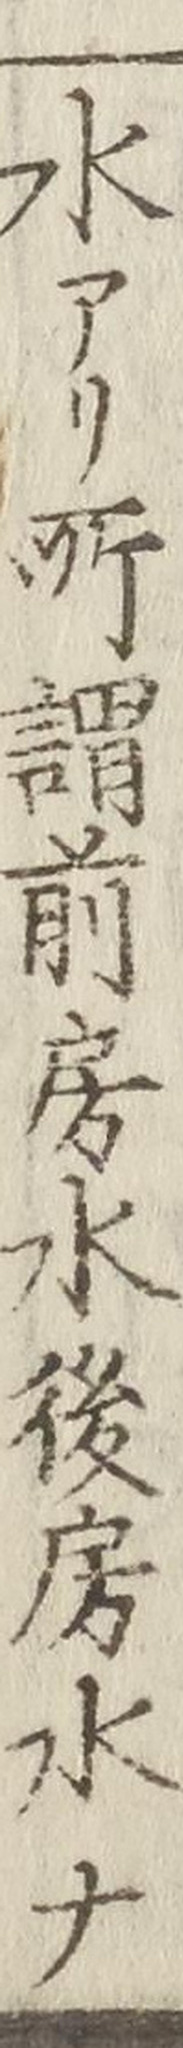水アリ所謂前房水後房水ナ
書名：護法新論　二編　下
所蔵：東京大学地震研究所図書室 Earthquake Research Institute Library, The University of Tokyo, JAPAN
